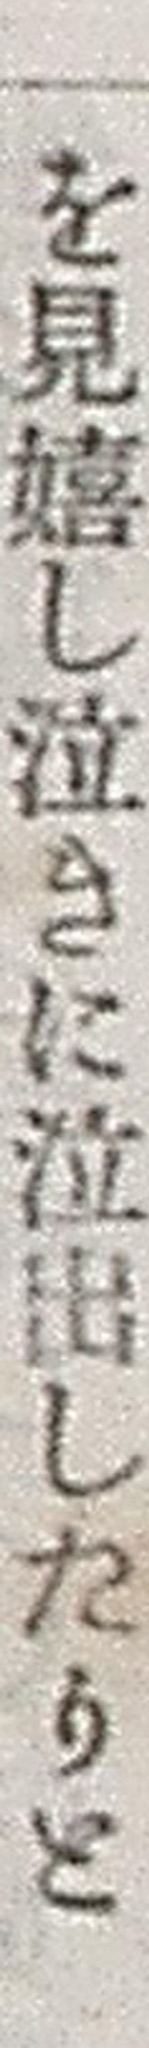を見嬉し泣きに泣出したりと
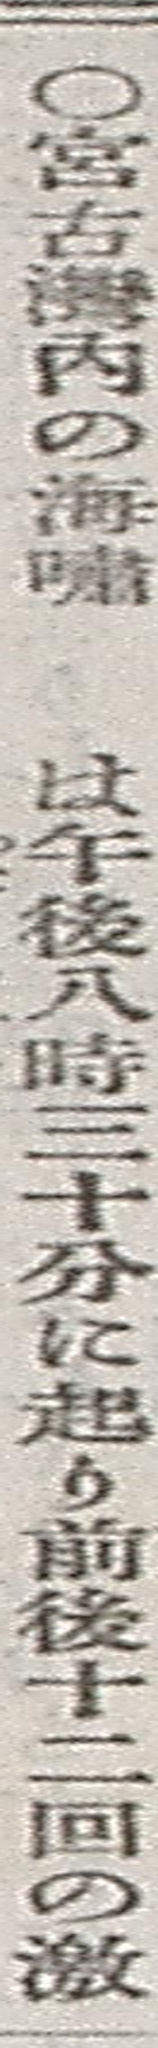○宮古湾内の海嘯は午後八時三十分に起り前後十二回の激
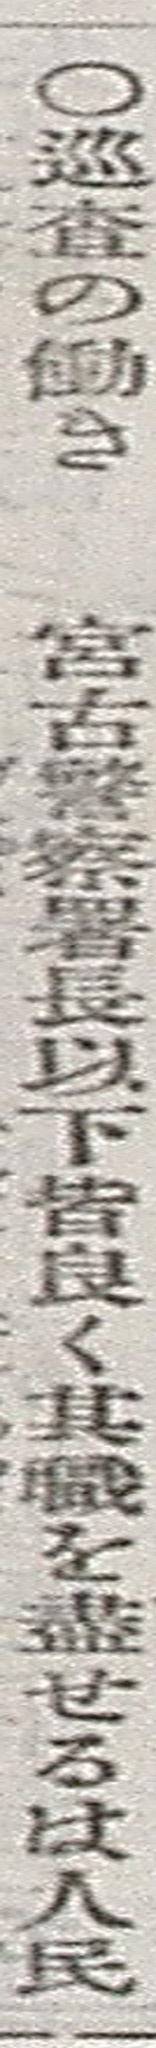○巡査の働き宮古警察署長以下皆良く其職を尽せるは人民
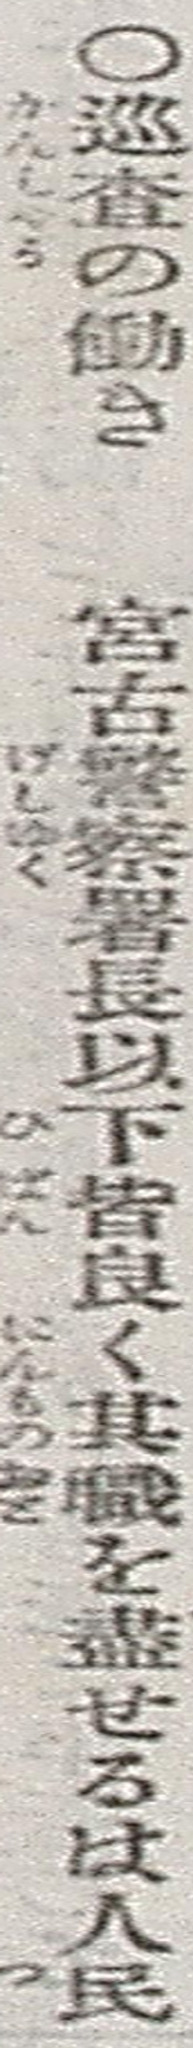○巡査の働き宮古警察署長以下皆良く其職を尽せるは人民
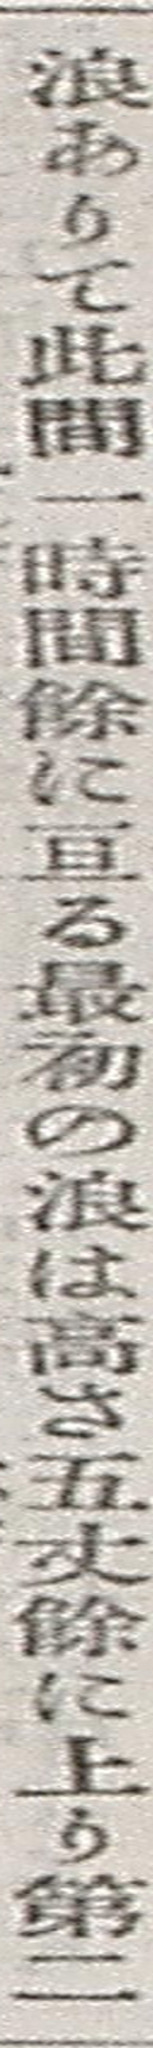浪ありて此間一時間余に亘る最初の浪は高さ五丈余に上り第二
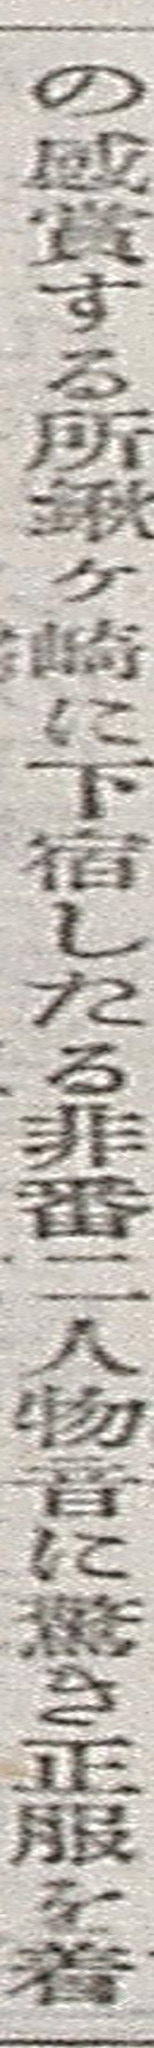の感賞する所鍬ヶ崎に下宿したる非番二人物音に驚き正服を着
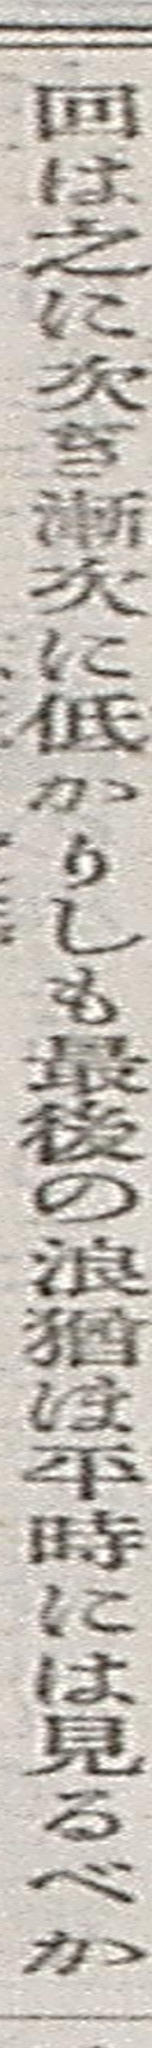回は之に次ぎ漸次に低かりしも最後の浪猶ほ平時には見るべか
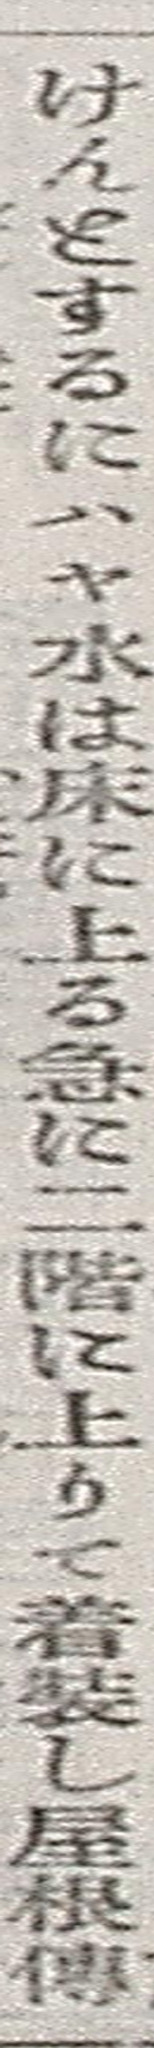けんとするハヤ水は床に上る急に二階に上りて着装し屋根伝
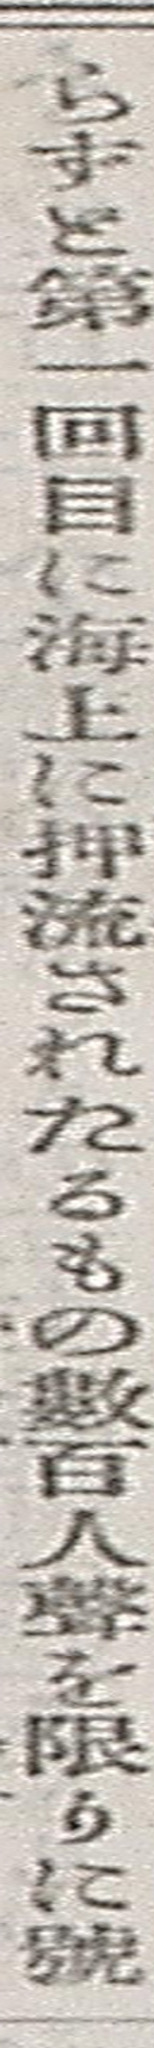らずと第一回目に海上に押流されたるもの数百人声を限りに号
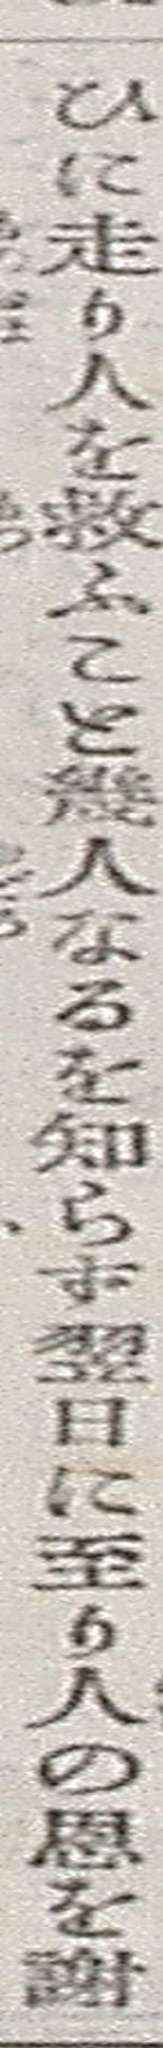ひに走り人を救ふこと幾人なるを知らず翌日に至り人の恩を謝
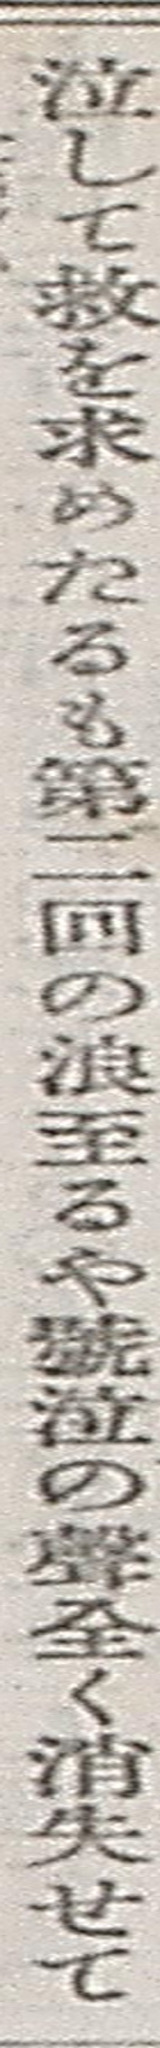泣して救を求めたるも第二回の浪至るや号泣の声全く消失せて
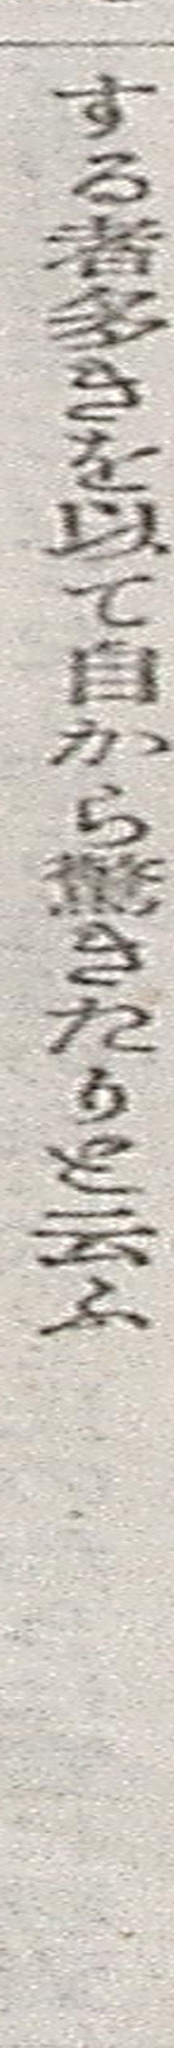する者多きを以て自から驚きたりと云ふ
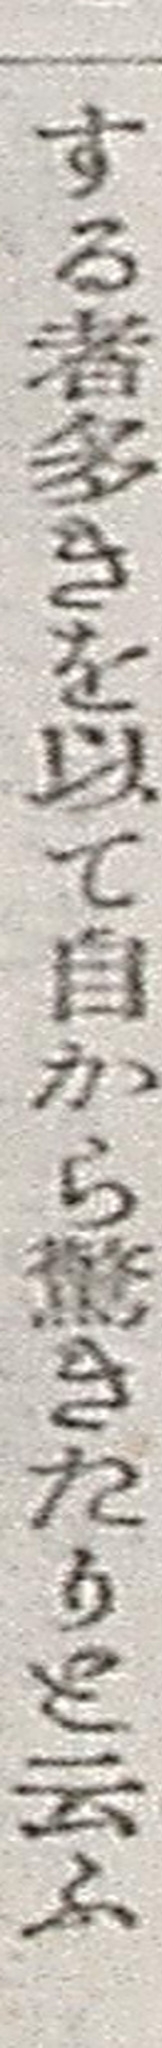する者多きを以て自から驚きたりと云ふ
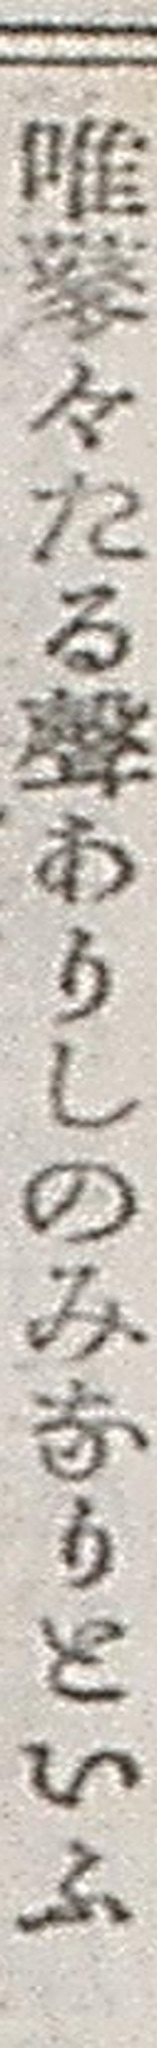唯苳々たる声ありしのみなりといふ
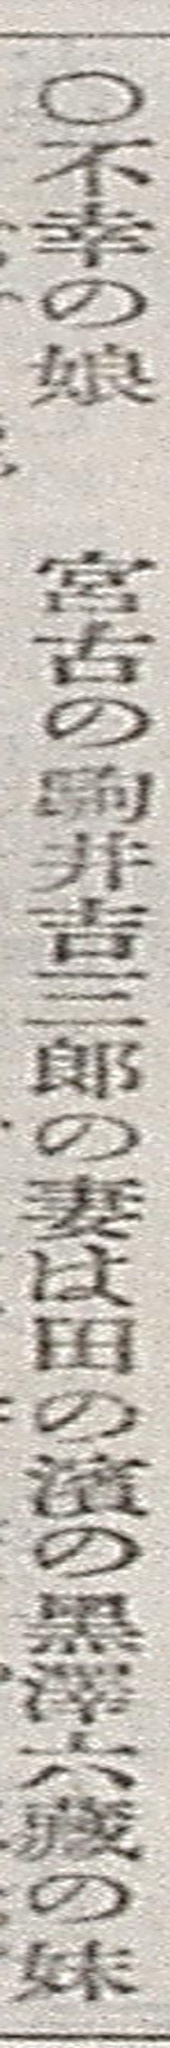○不幸の娘宮古の駒井吉三郎の妻は田の浜の黒沢六蔵の妹
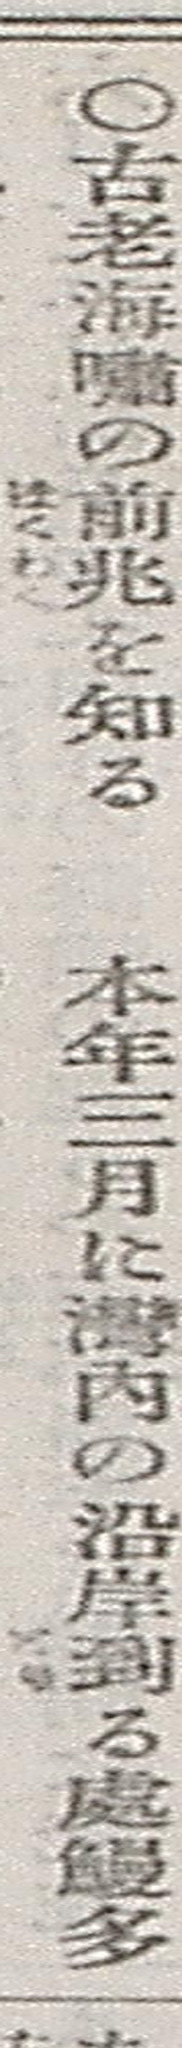○古老海嘯の前兆を知る本年三月に湾内の沿岸到る処鰻多
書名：風俗畫報臨時増刊第百二十號　大海嘯被害録（下）
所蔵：東京大学地震研究所図書室 Earthquake Research Institute Library, The University of Tokyo, JAPAN
